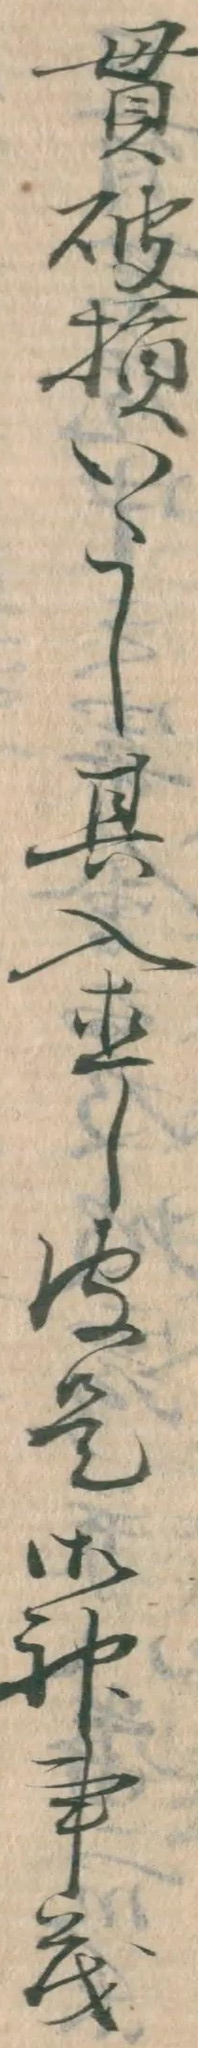貫破損いたし其入直し皮是御神事茂
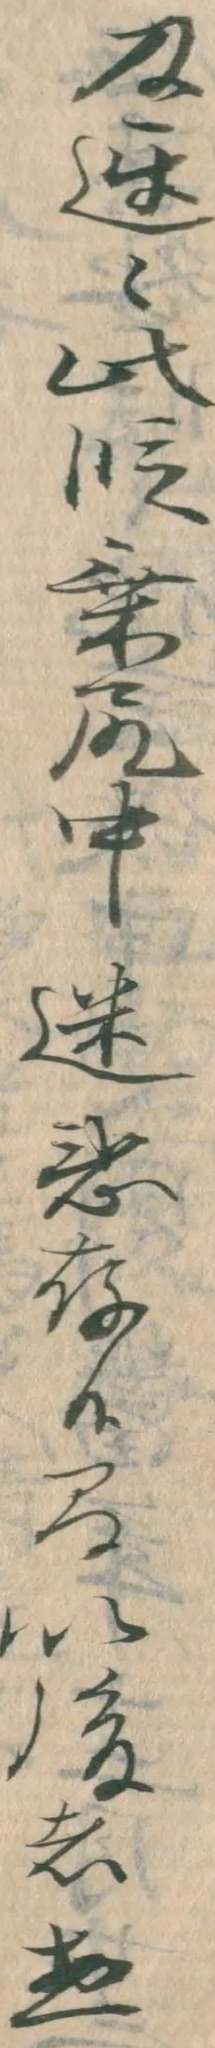及遅々此段乗尻中迷惑存候間以後者惣
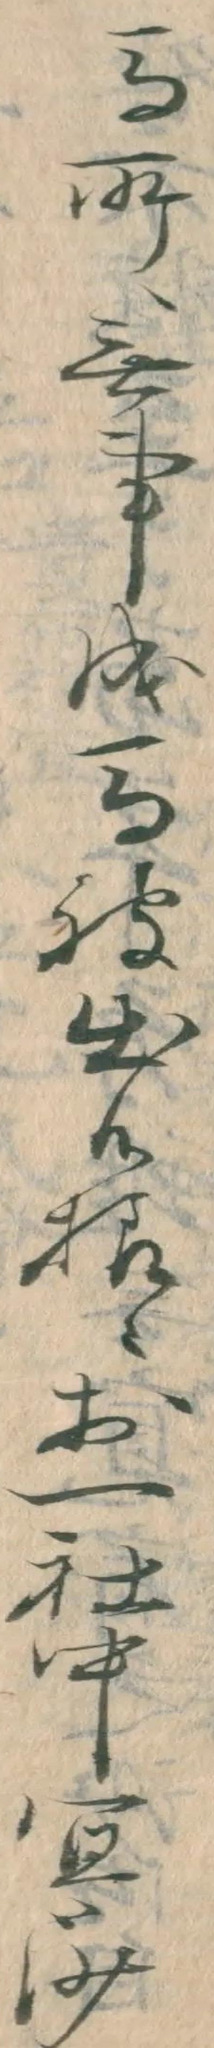馬所へ無事成馬被出候様ニ於一社中宜御沙
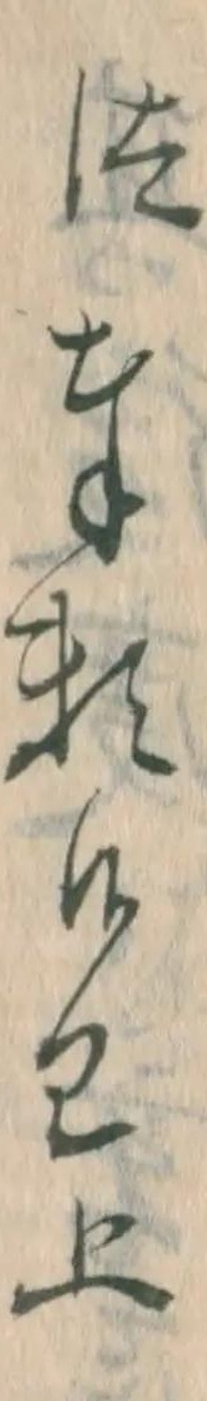汰奉頼候已上
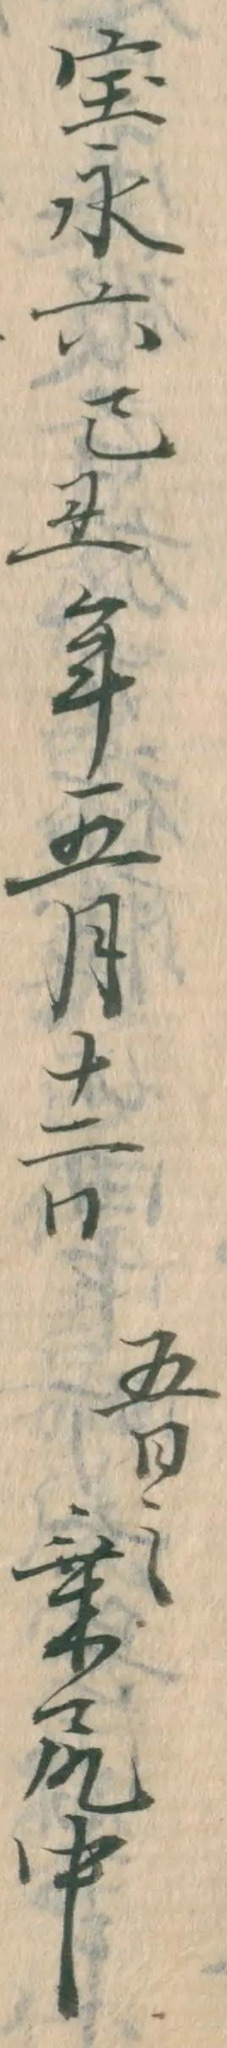宝永六己丑年五月十二日乗尻中
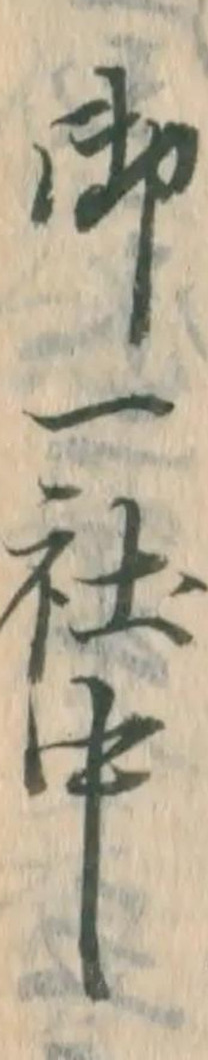御一社中

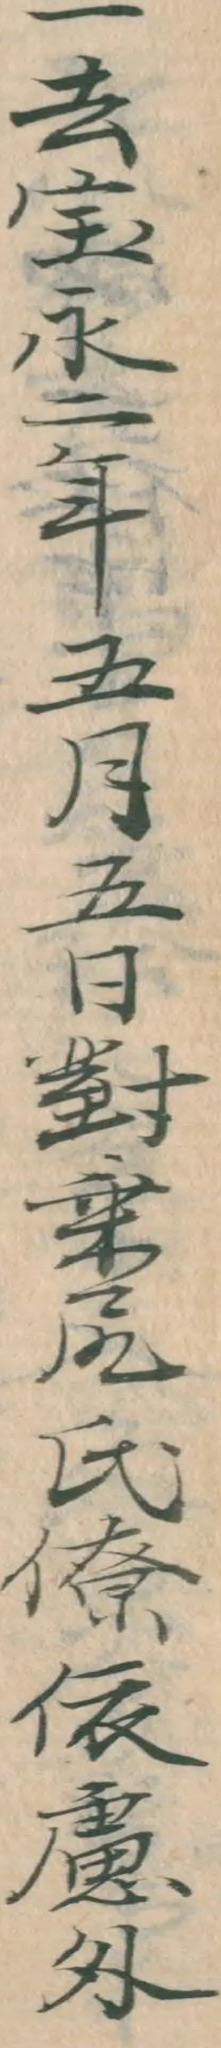一去宝永二年五月五日対乗尻氏僚依慮外
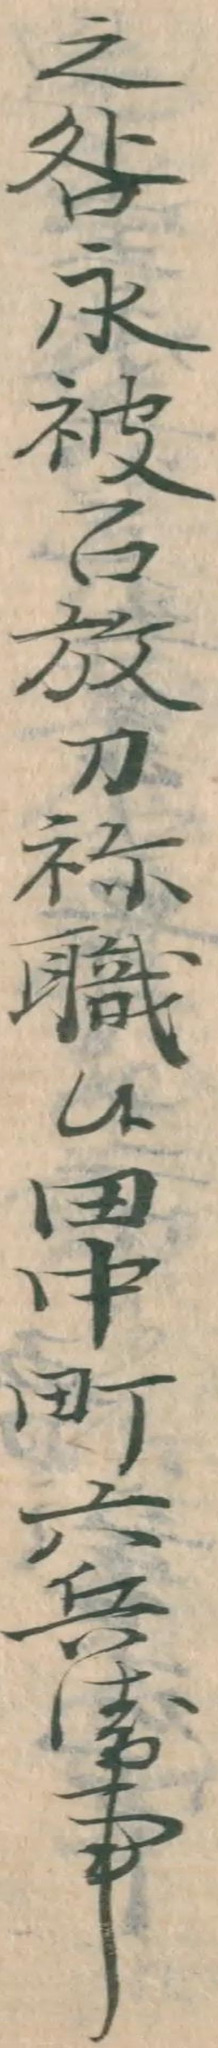之咎永被召放刀祢職候田中町六兵衛事
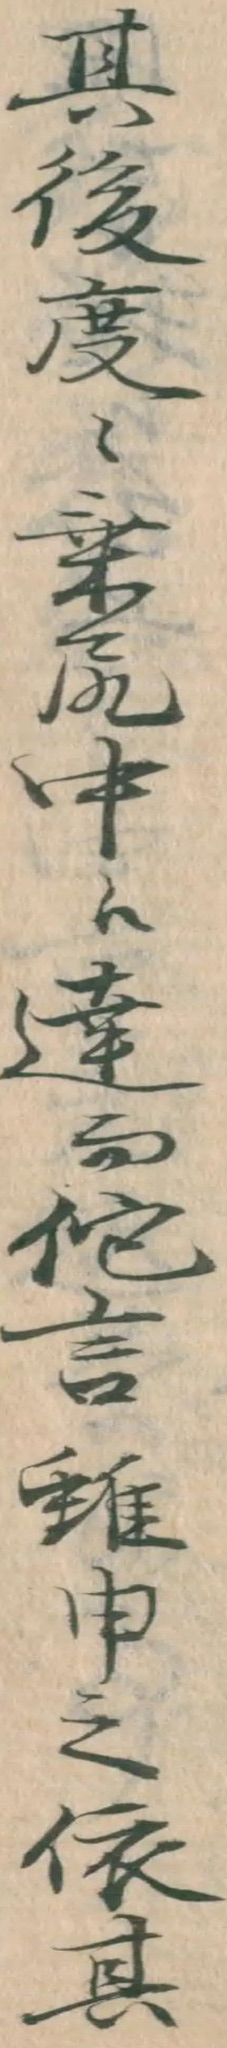其後度々乗尻中江達而佗言雖申之依其
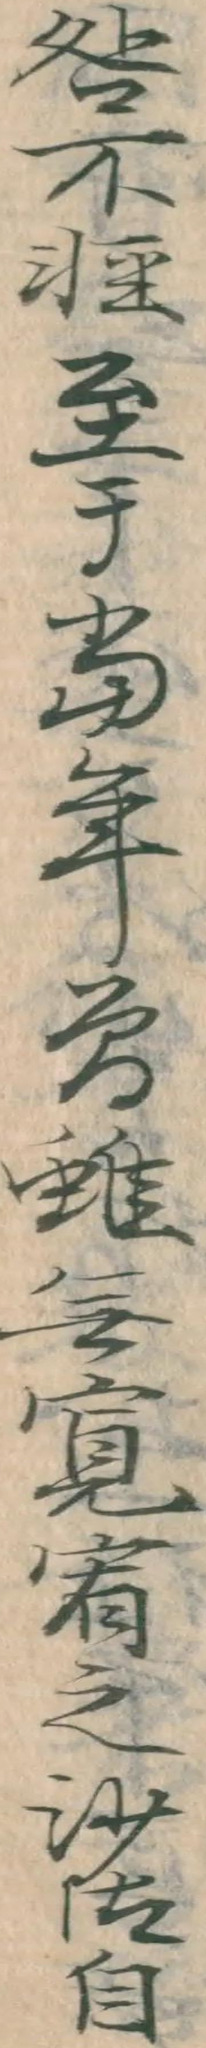咎不軽至于当年曽雖無寛宥之沙汰自
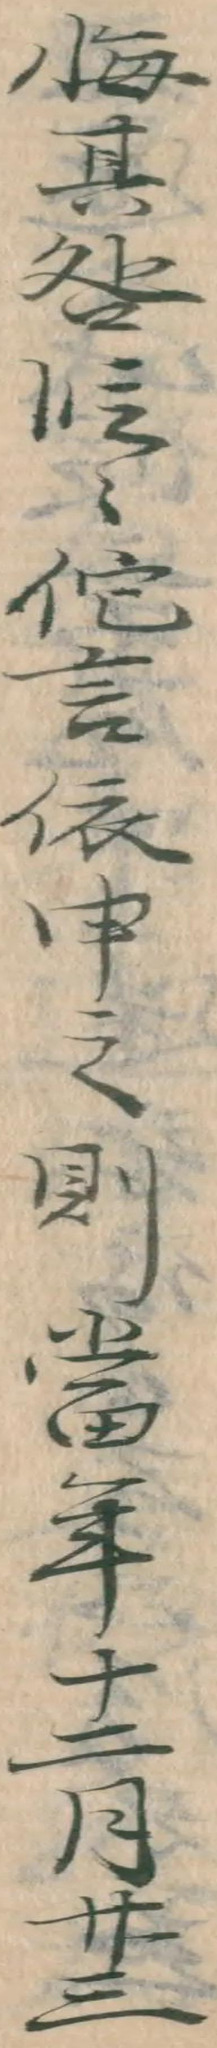悔其咎段々佗言依申之則当年十二月廿三
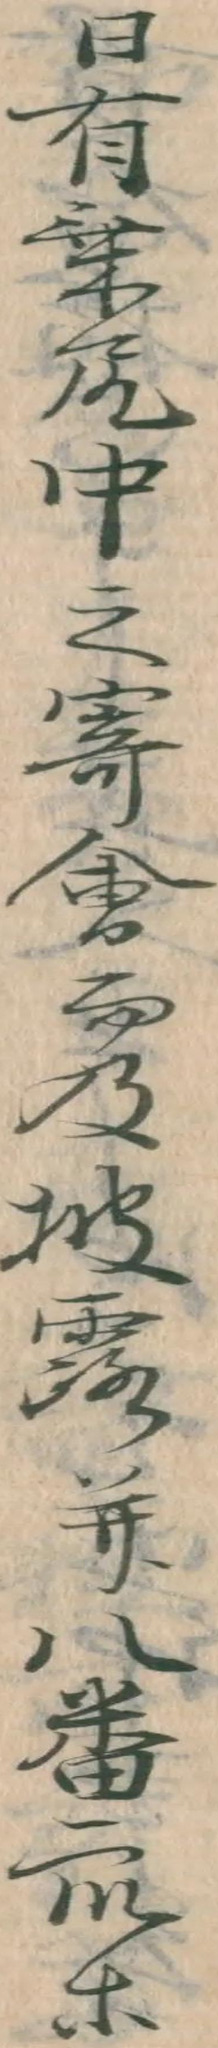日有乗尻中之寄会而及披露并八番衆等
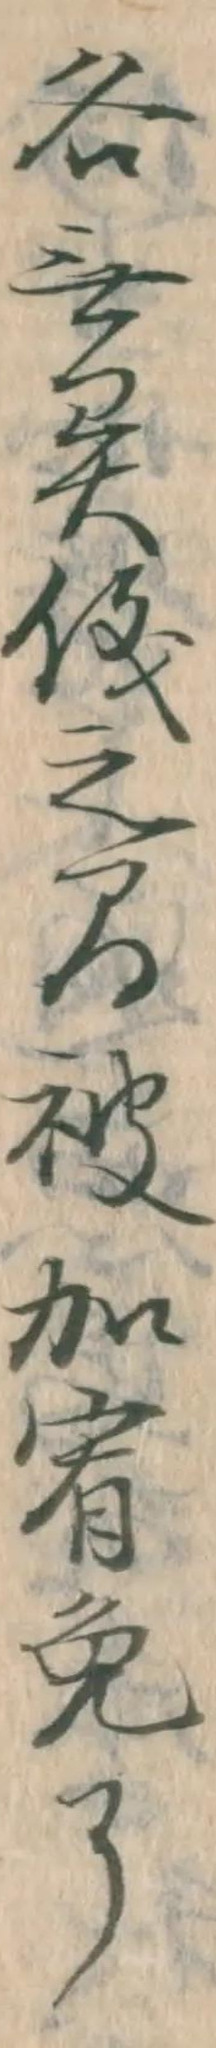各無異儀之間被加宥免了
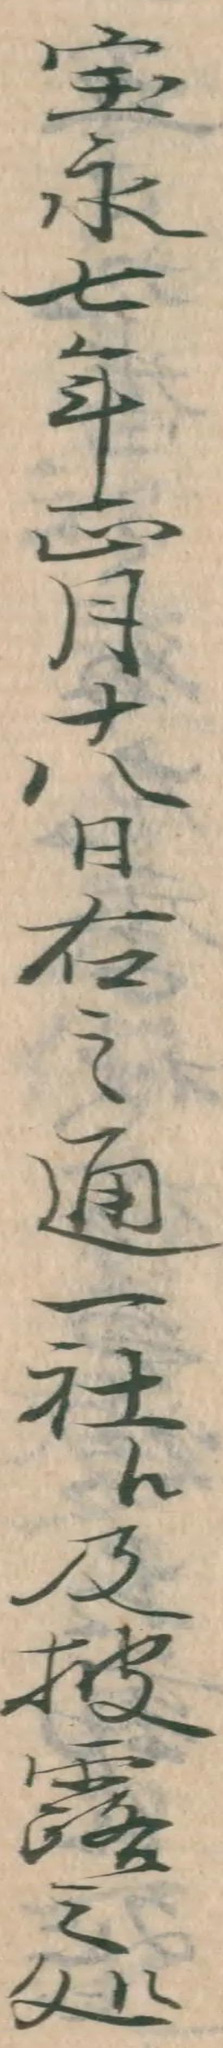宝永七年正月十八日右之通一社江及披露之処
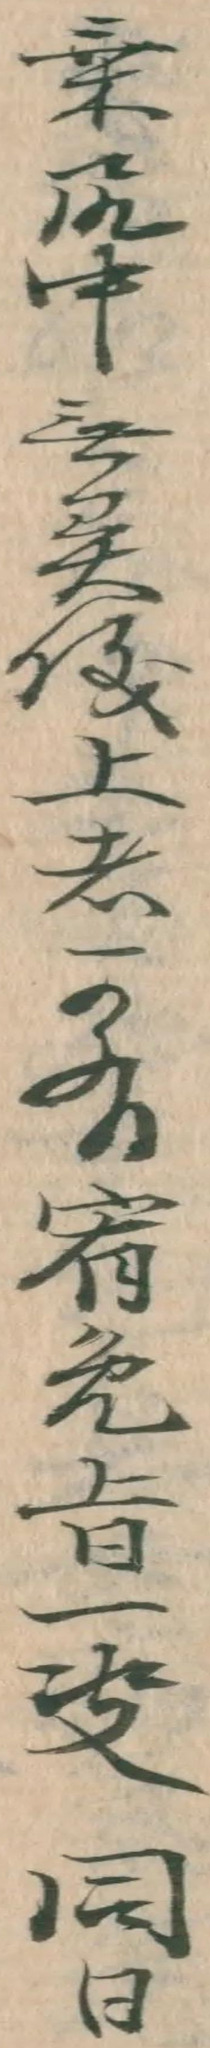乗尻中無異儀上者可有宥免旨一決同日
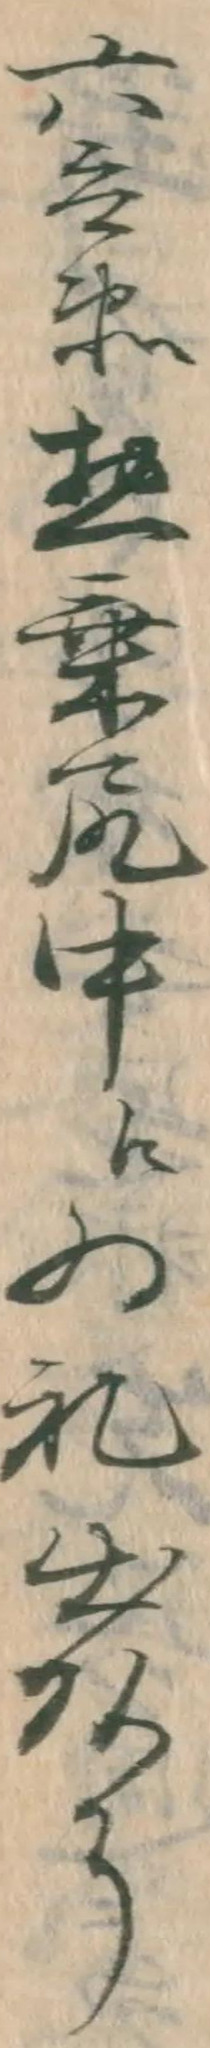六兵衛惣乗尻中江為礼出頭了
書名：賀茂社記録. 第10冊
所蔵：国立国会図書館 National Diet Library, JAPAN
